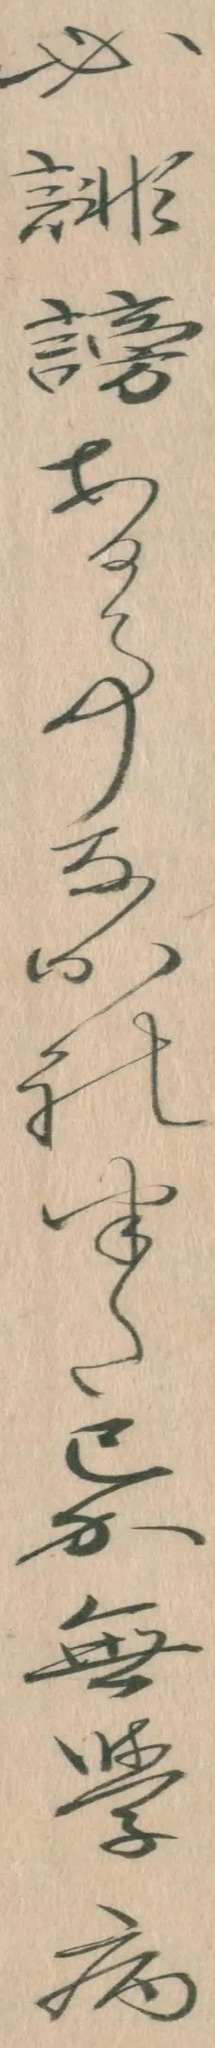必誹謗ある事なかれまた己か無学病
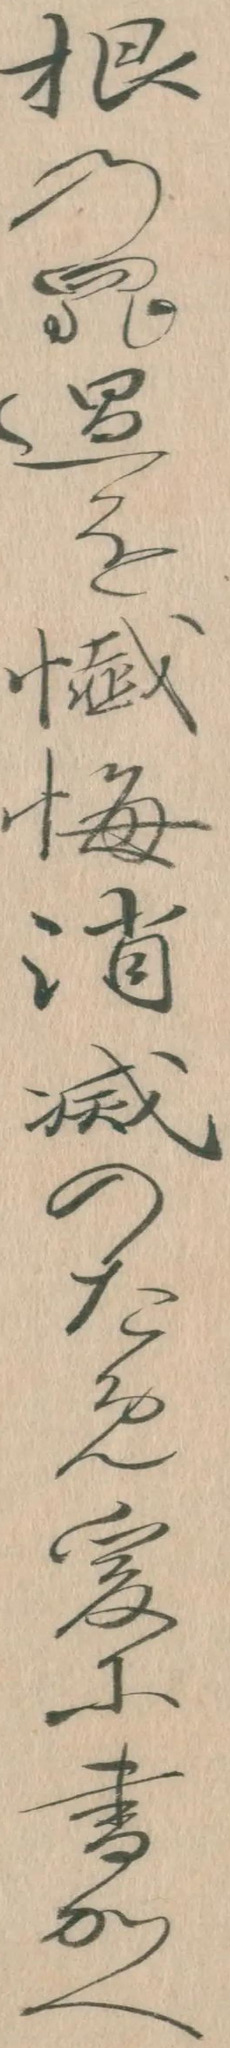根の罪過を懴悔消滅のため爰に書加へ
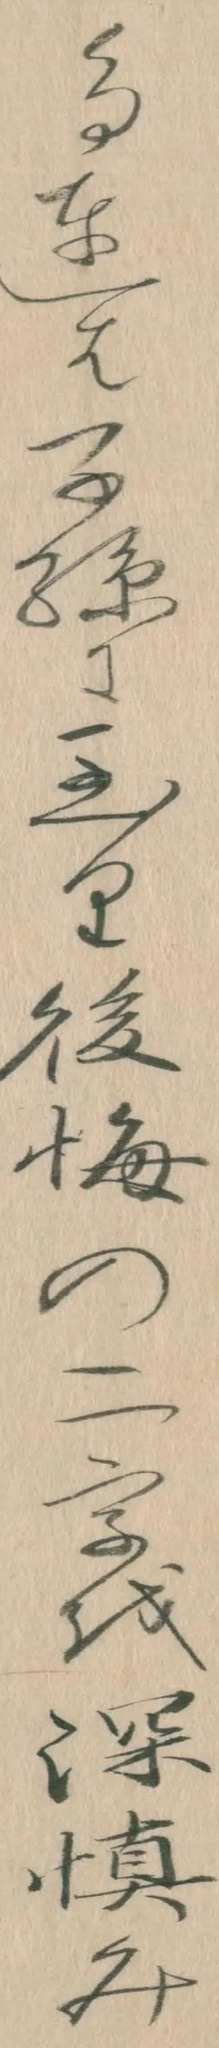たれは子孫に至り後悔の二字を深慎み
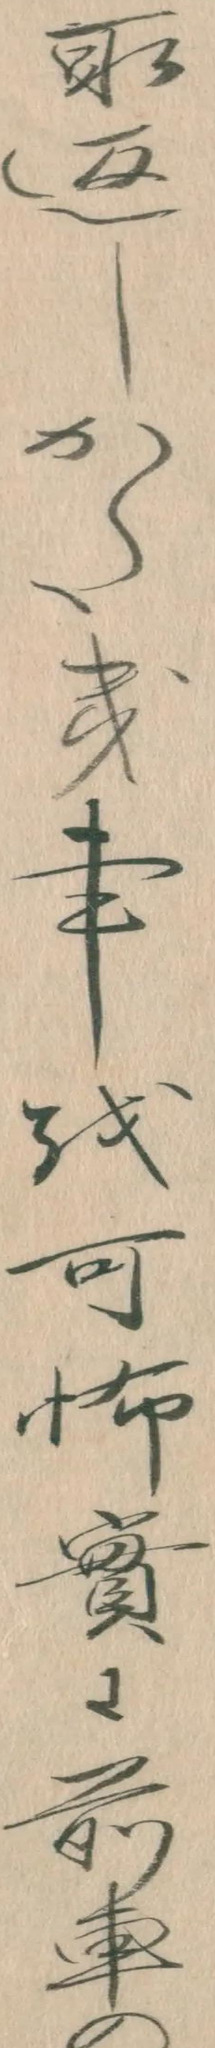取返しかたき事を可怖実に前車の
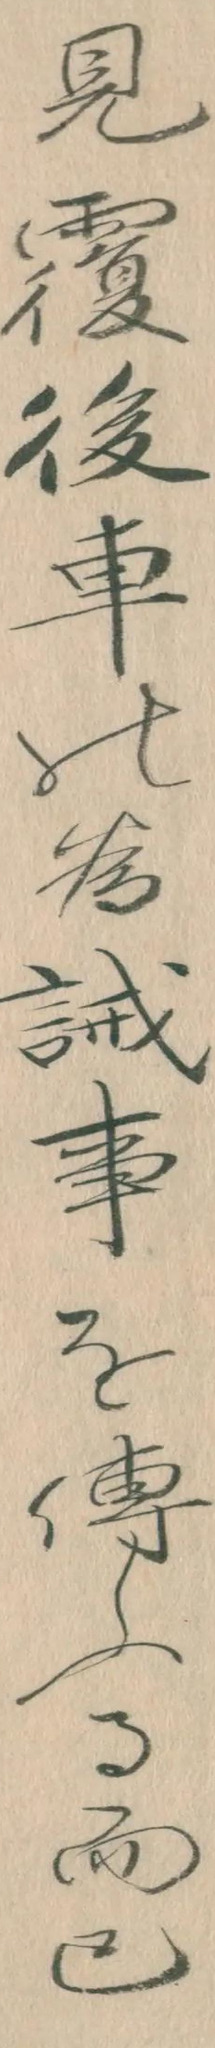見覆後車の為誡事を伝ふる而已
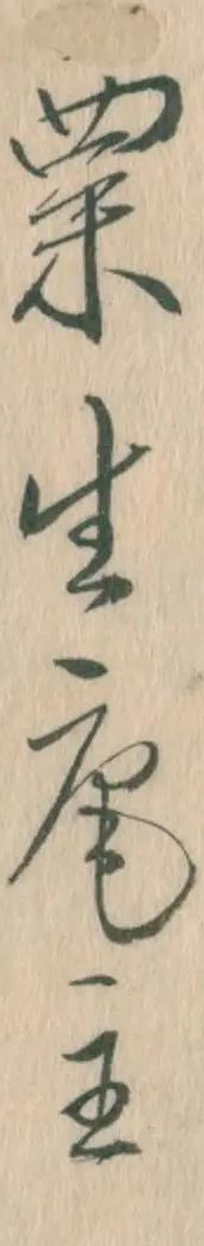粟生庵主
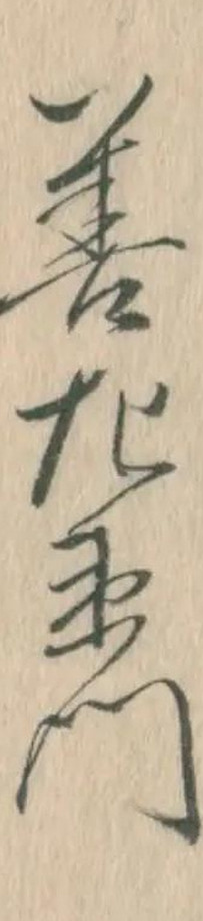善左衛門

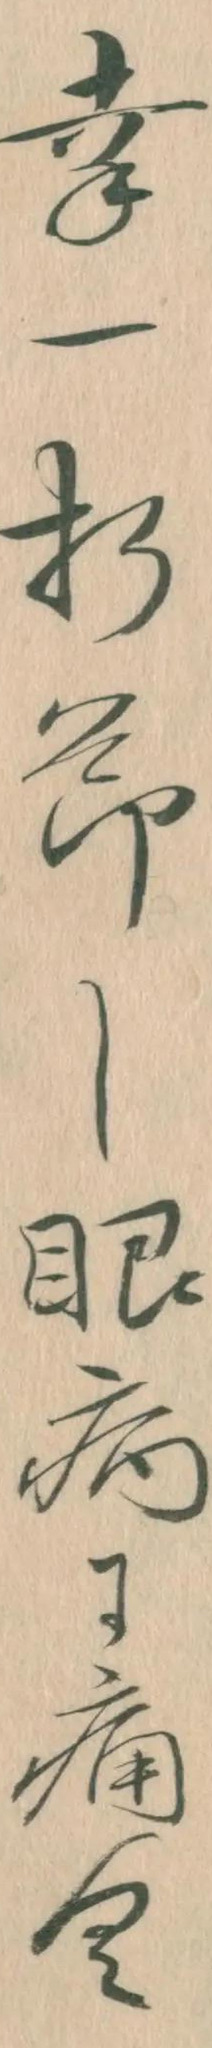幸一折節し眼病に痛く
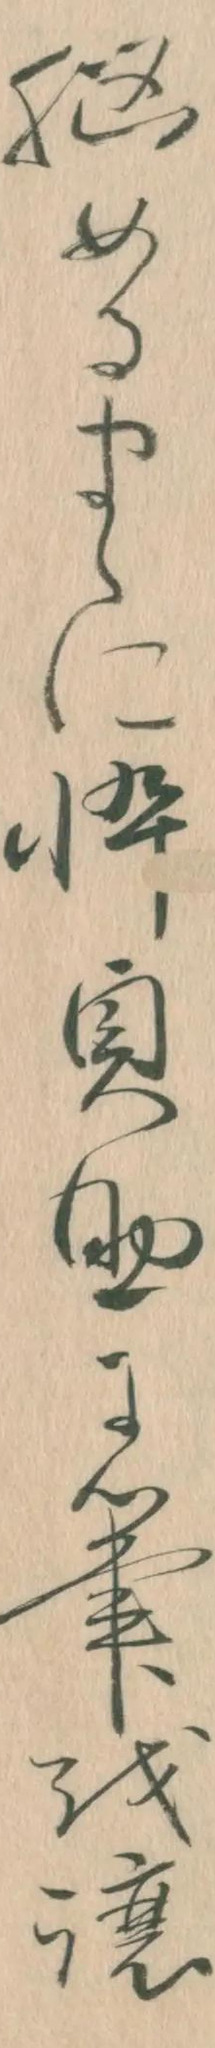悩めるまゝに忰貞助に筆を譲
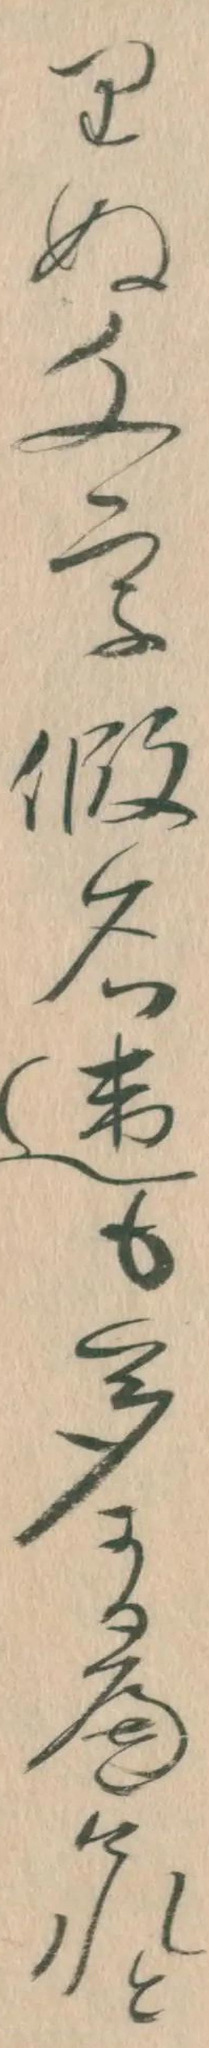りぬ文字仮名違も多かるへけれと
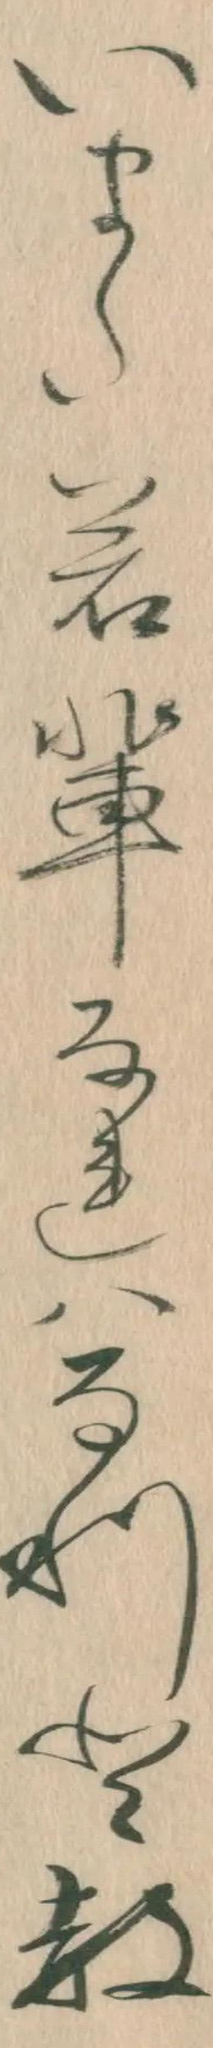いまた若輩なれはなりと教
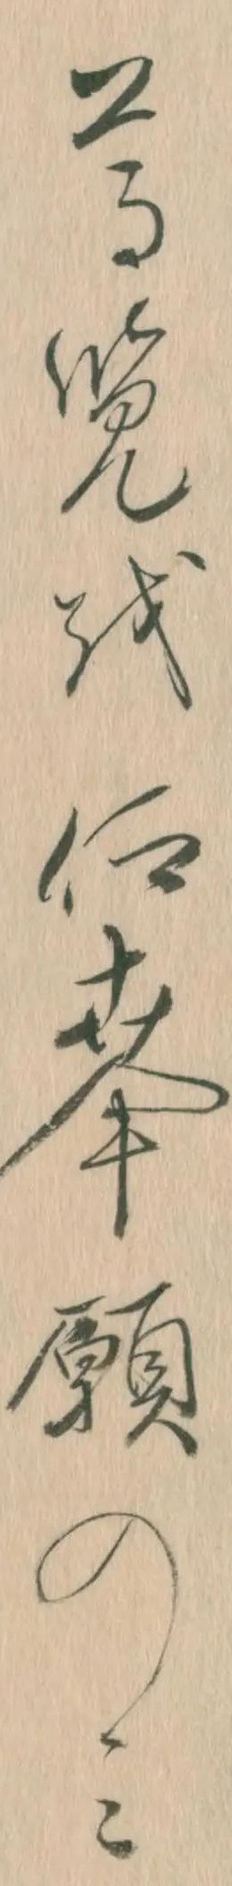学覧を仰奉願のみ
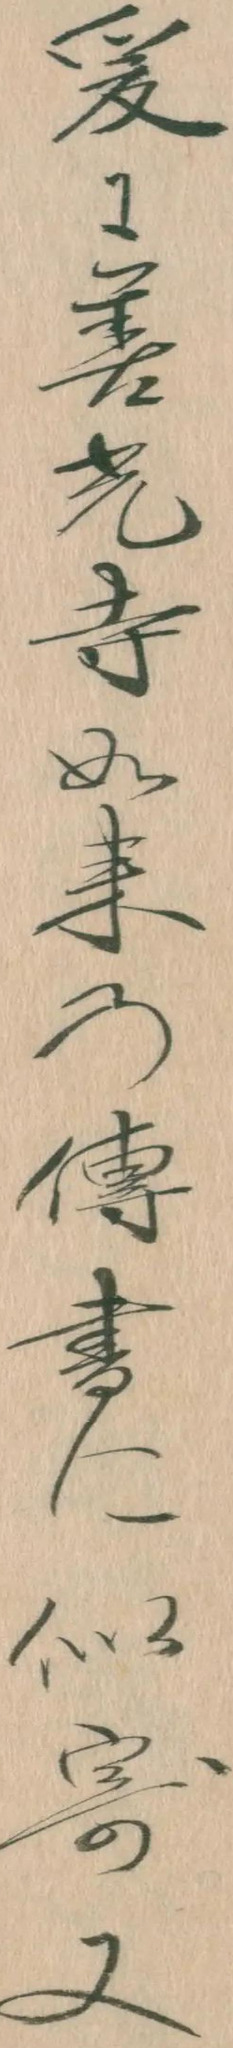爰に善光寺如来の伝書に似寄又
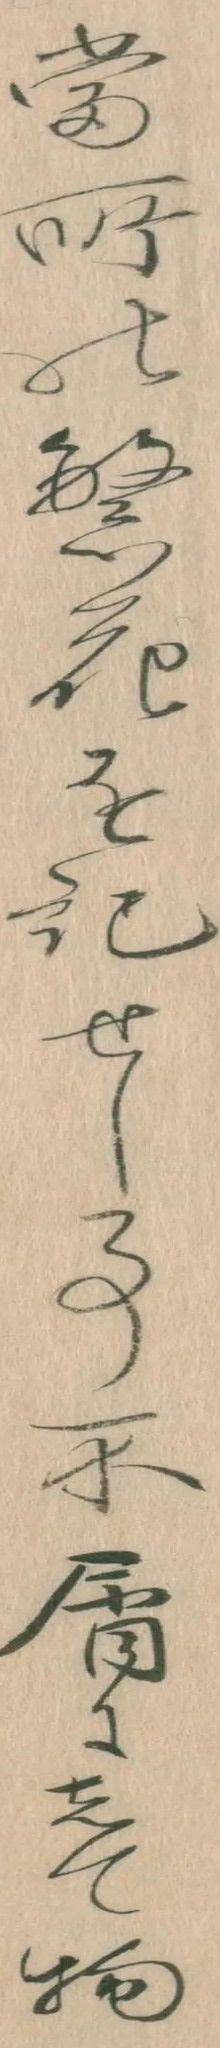当所の繁花を記せし事不屑にして物
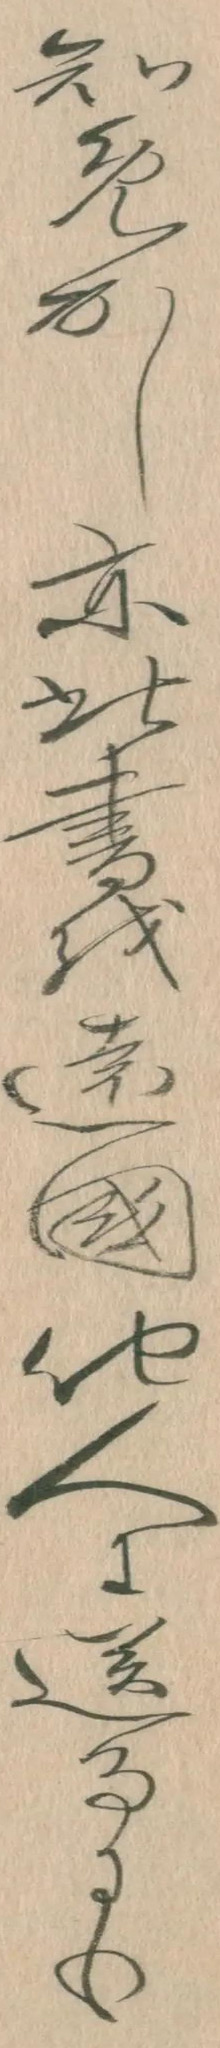知めかし亦此書を遠国他人に送るにも
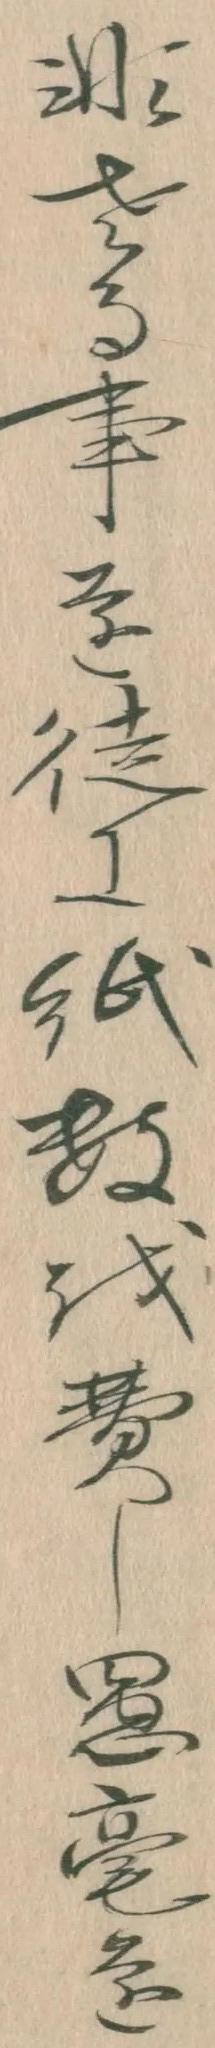非さる事を徒に紙数を費し愚毫を
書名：俗語之種. [1]
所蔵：国立国会図書館 National Diet Library, JAPAN
